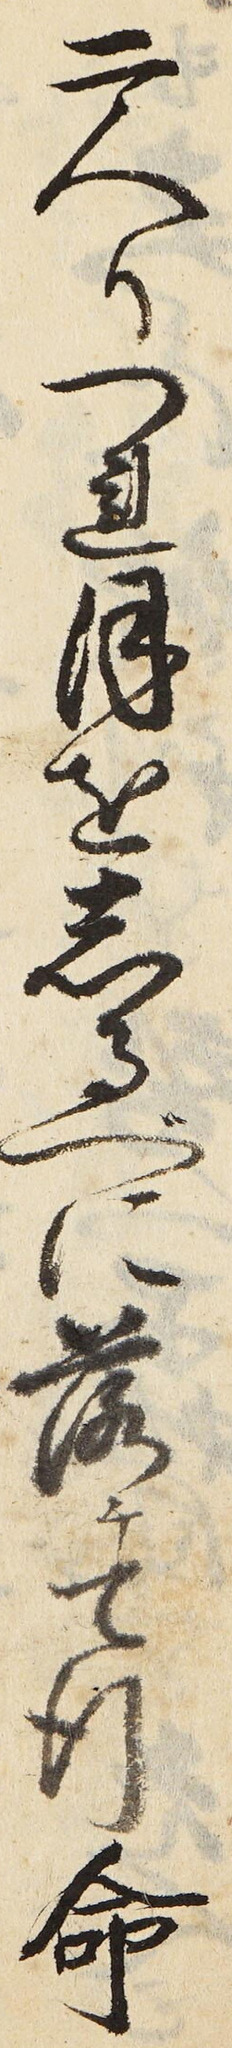二人りつれ月をしるべに落ちて行命
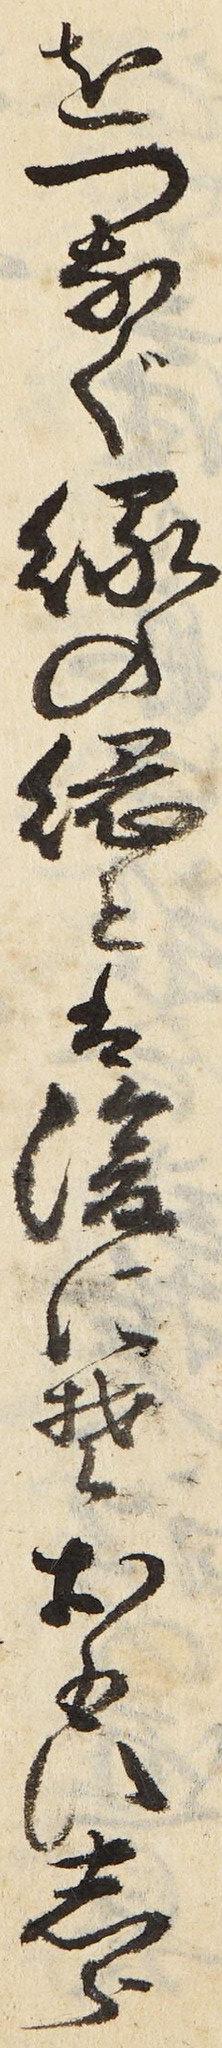をつなぐ縁の綱とは後にそおもひしら
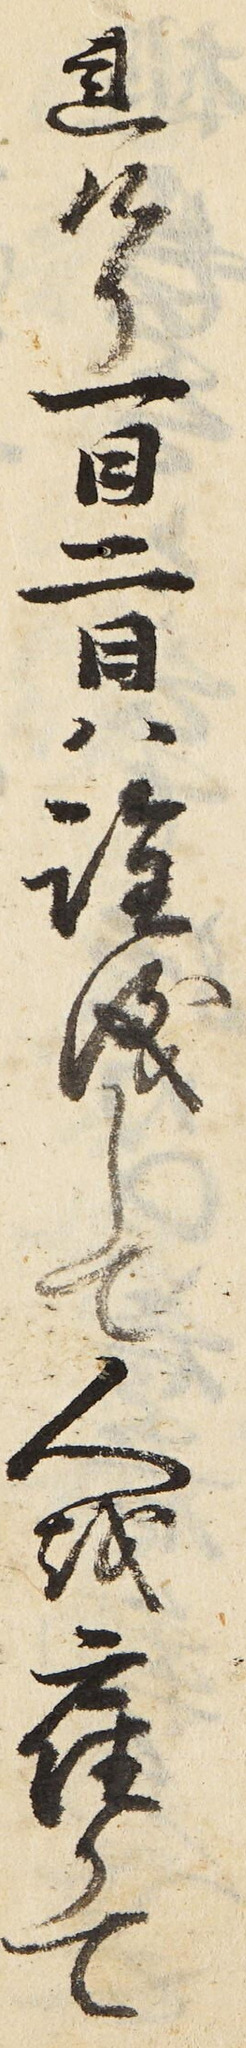れけり一日二日は詮儀して人を雇うて
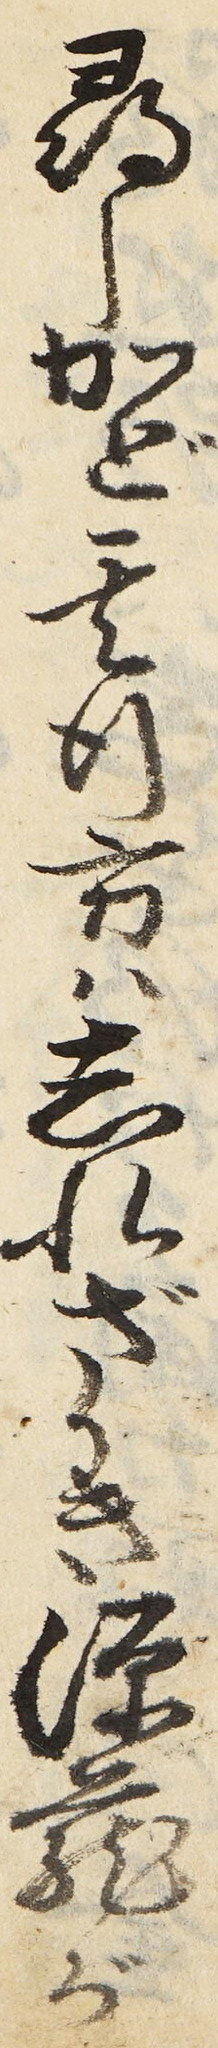尋しかど其行方はしれざりき源蔵が
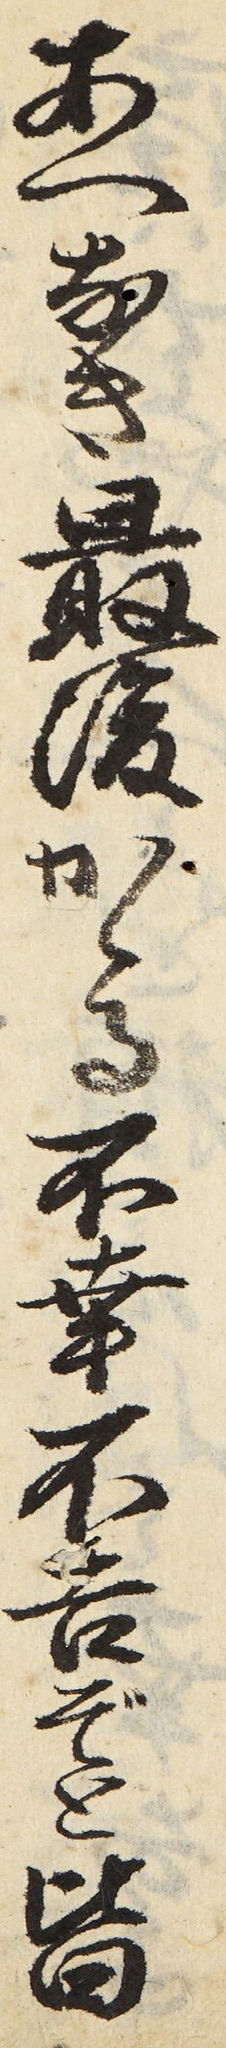あへなき最後かゝる不幸不吉ぞと皆
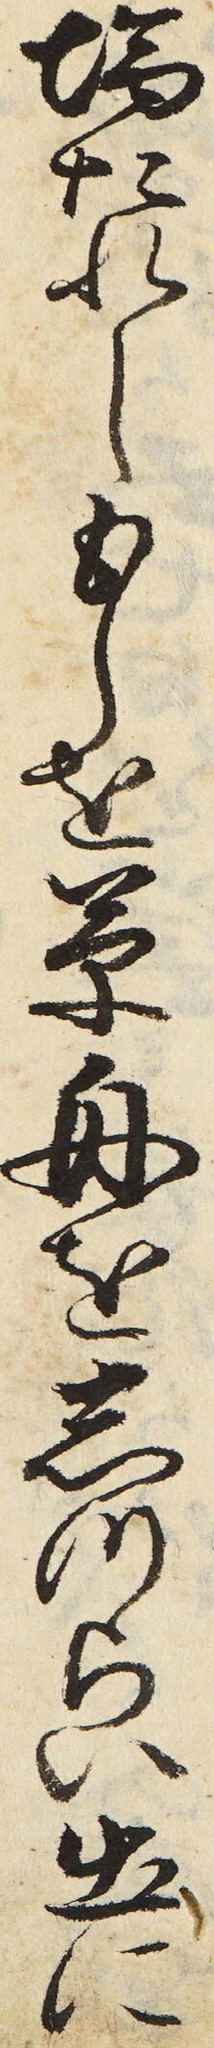塩たれしもしを草舟をしつらい出に
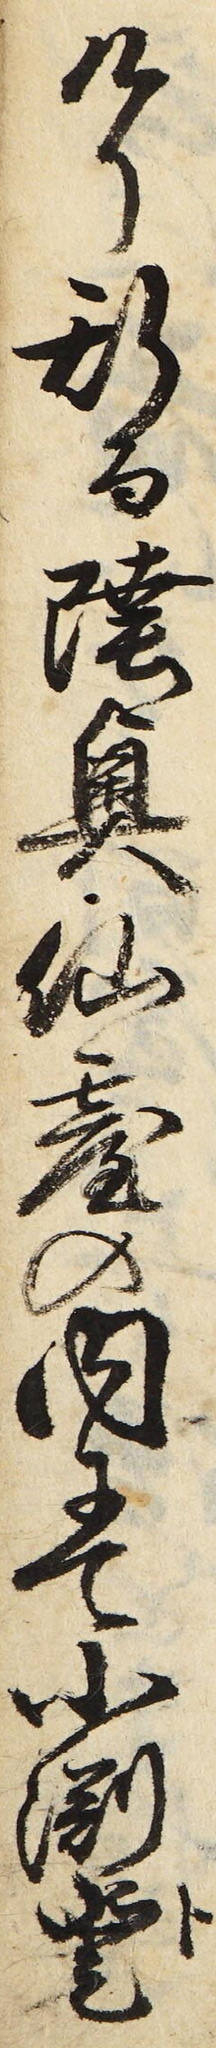けり斯而陸奥仙台の内にて小渕と

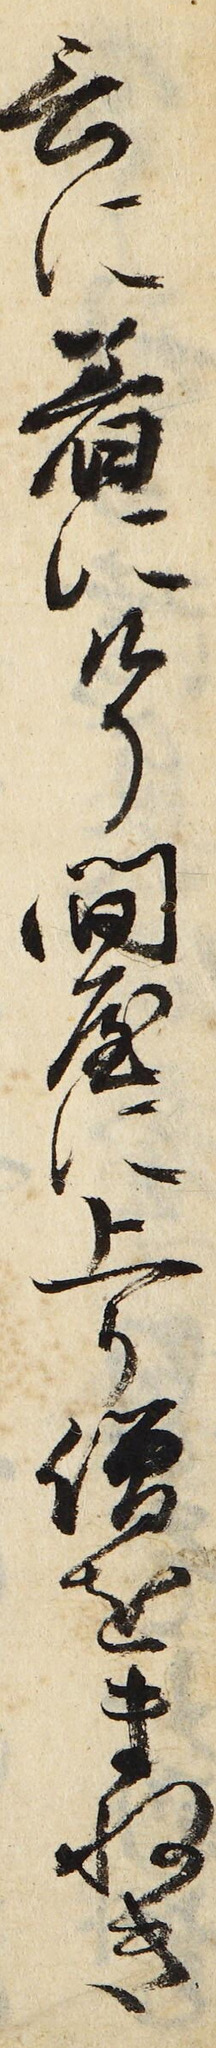云に着にけり問屋に上り僧をまねき
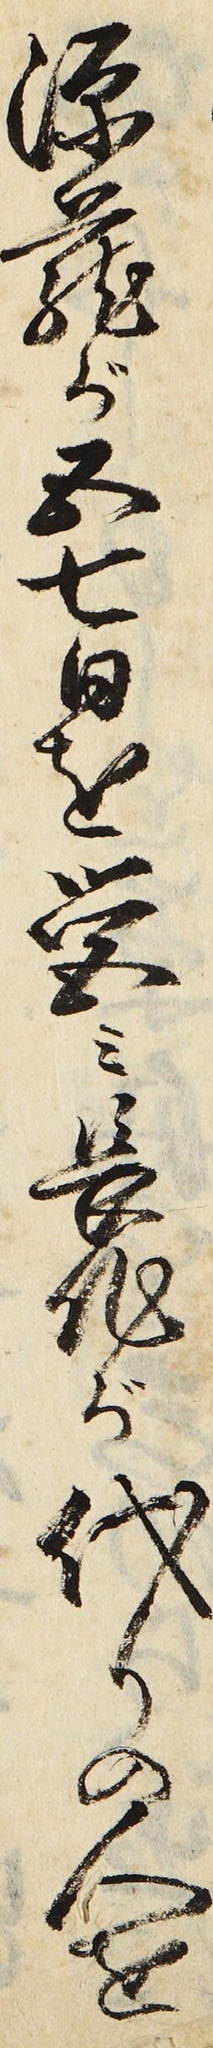源蔵が五七日を営み長作が代りの人を
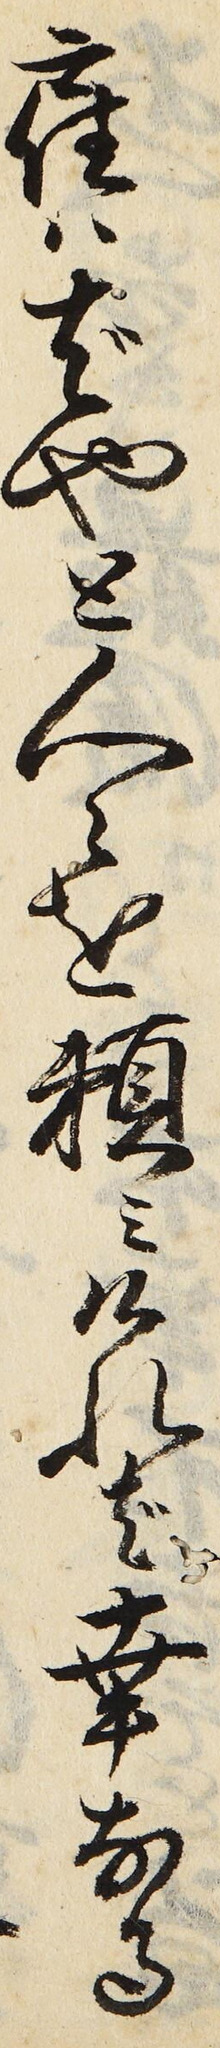雇はばやと人々を頼みければ幸なる
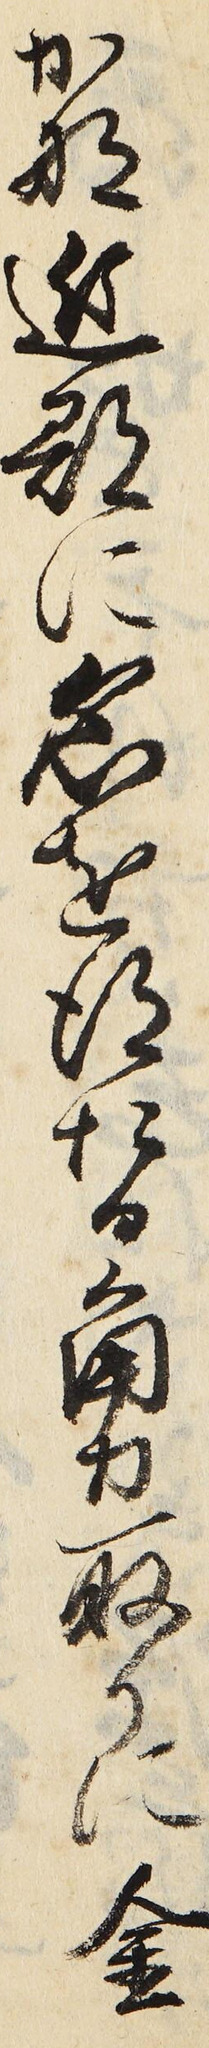かな近郡に名を得たる角力取りに金
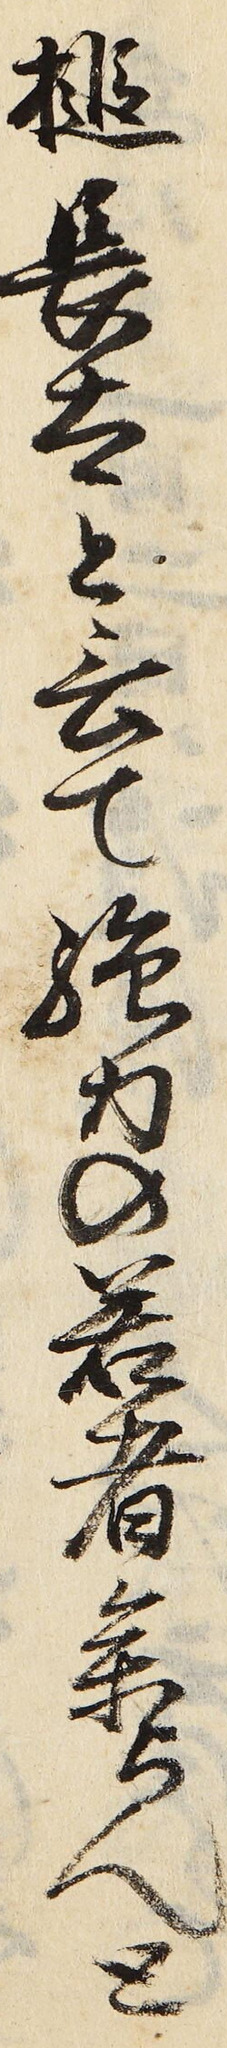槌長太と云て強力の若者参らんと
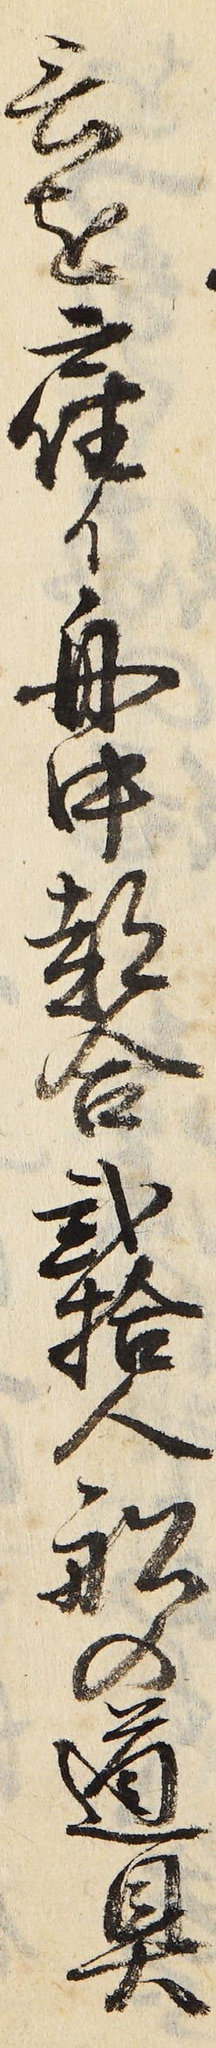云を雇い舟中都合弐拾人船の道具
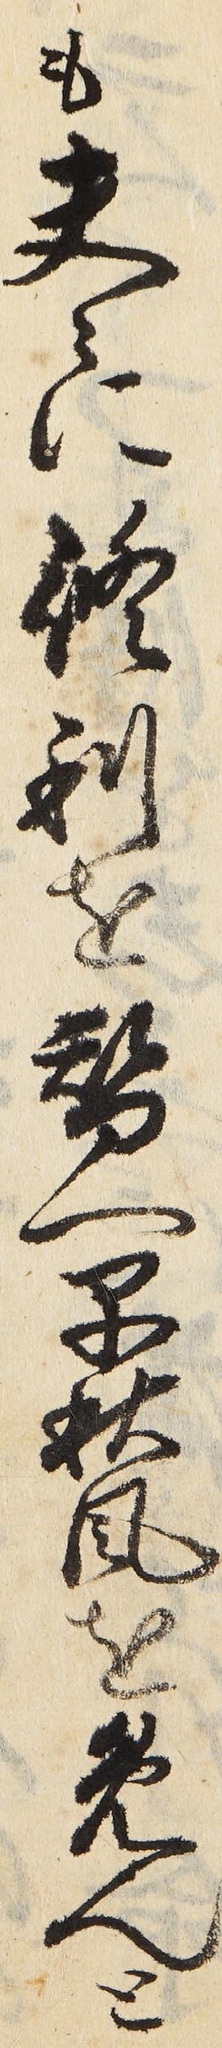も夫々に修利を替へ早秋風を免んと
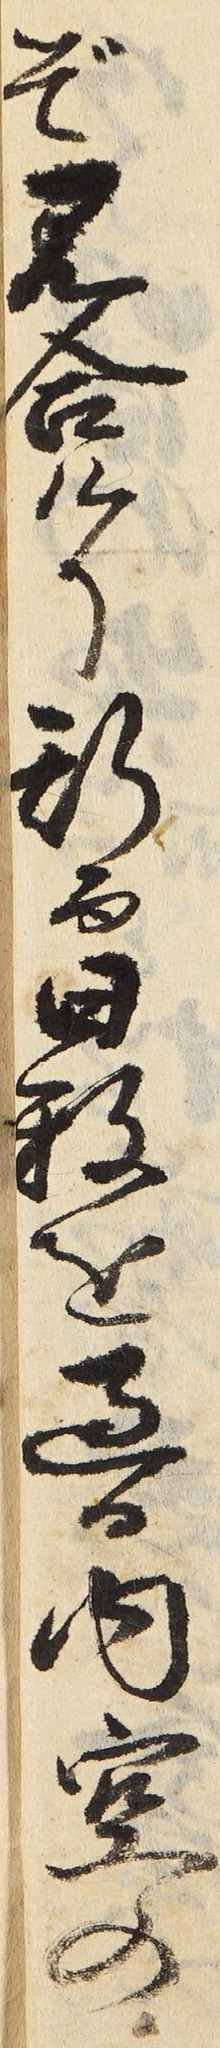ぞ見合けり斯而日数を過る内空の
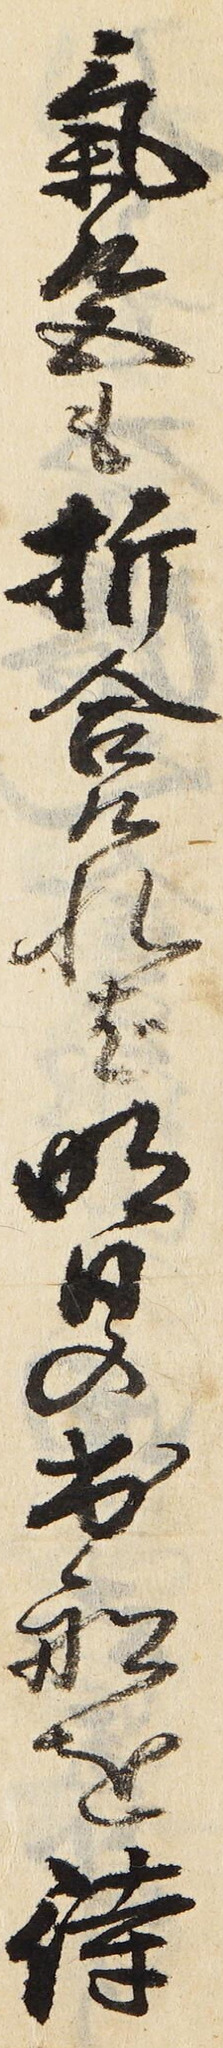気色も折合ければ明日の出船を待
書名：華夷九年録
